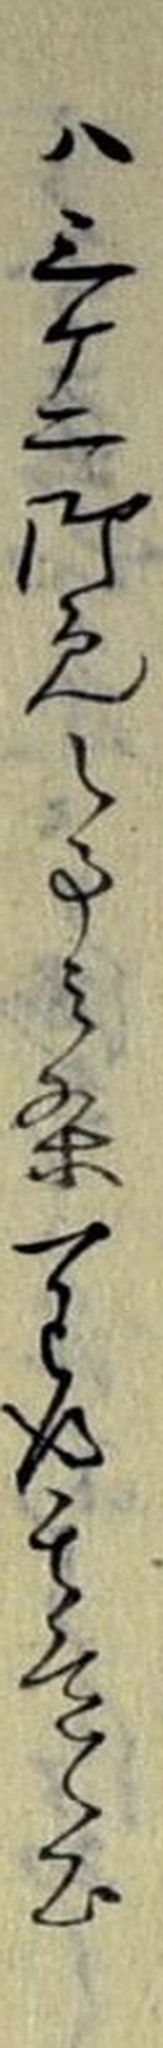ハ三ケ二御免之事ニ候条可被得其意候以上
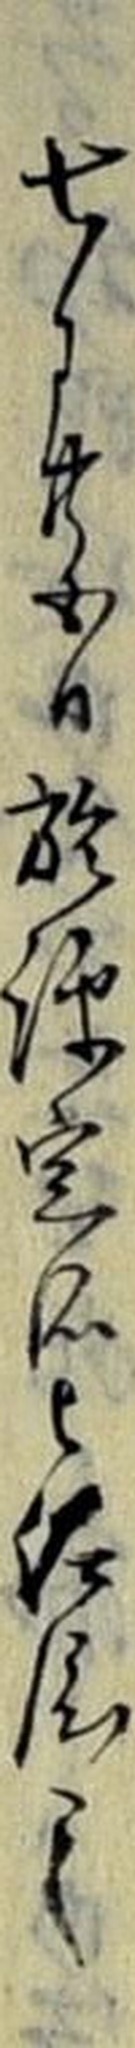七月廿五日於評定所被仰渡之
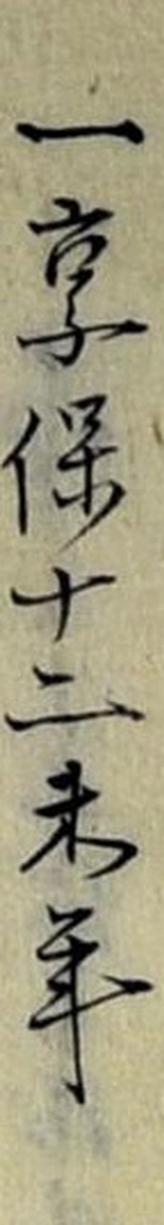一享保十二未年
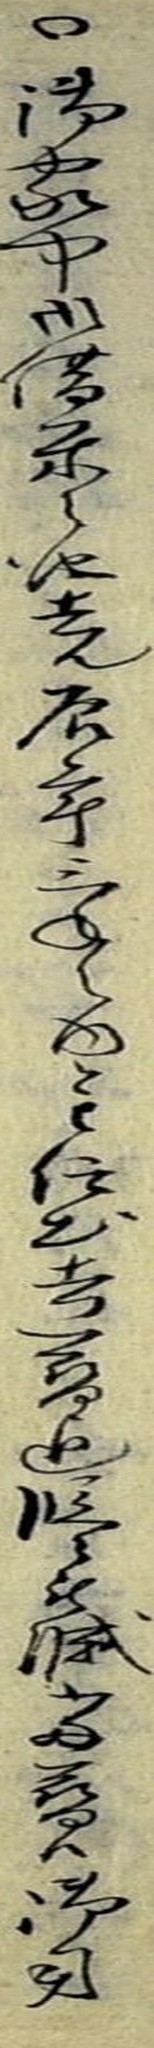〇御家中御借米之儀去ル辰年三年之内と被仰出去暮迄段々減当暮ハ御用
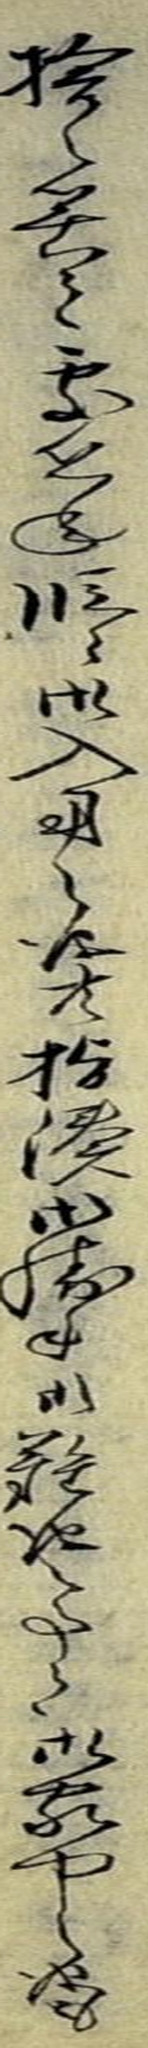捨之筈之処近年段々御入用之儀共指湊御勝手御難儀之事ニ候御家中之儀も
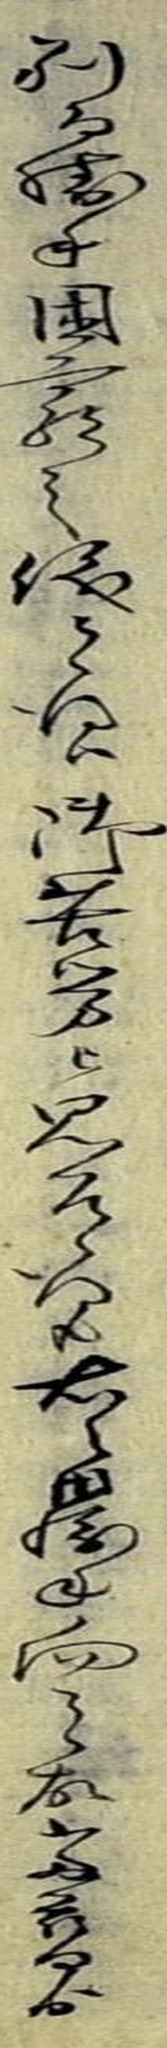別而勝手困窮之儀ニ候得ハ御苦労被思召候得共右之御勝手向ニ候故当暮ゟ
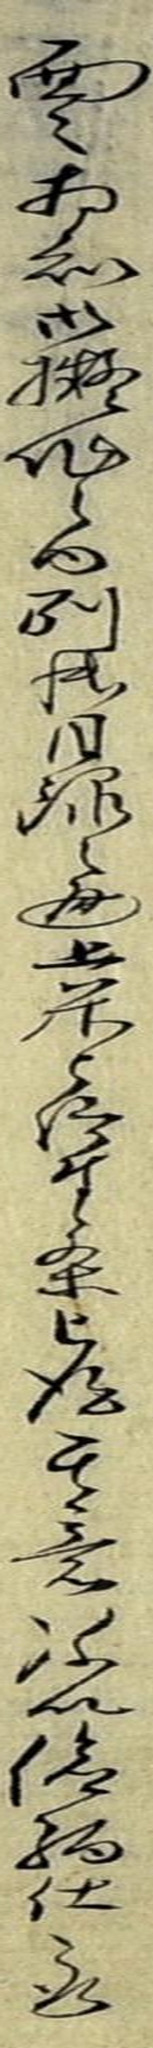面々拝知御擬作之内別紙目録之通上米被仰付候条被得其意弥以倹約仕取
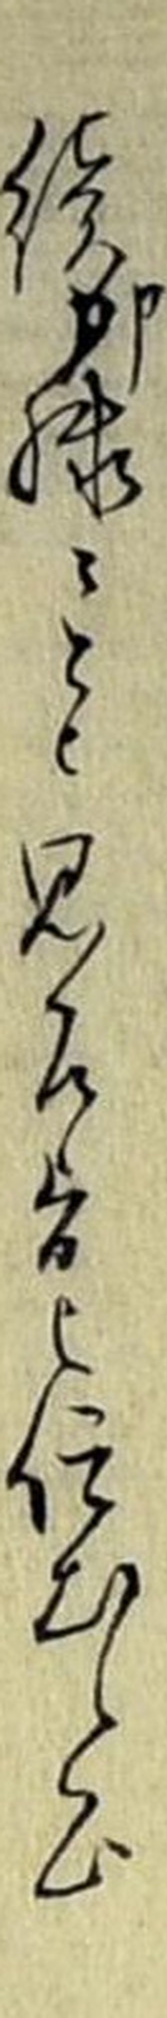続申様ニと被思召旨被仰出候以上
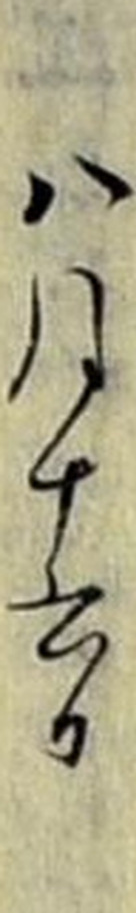八月十六日
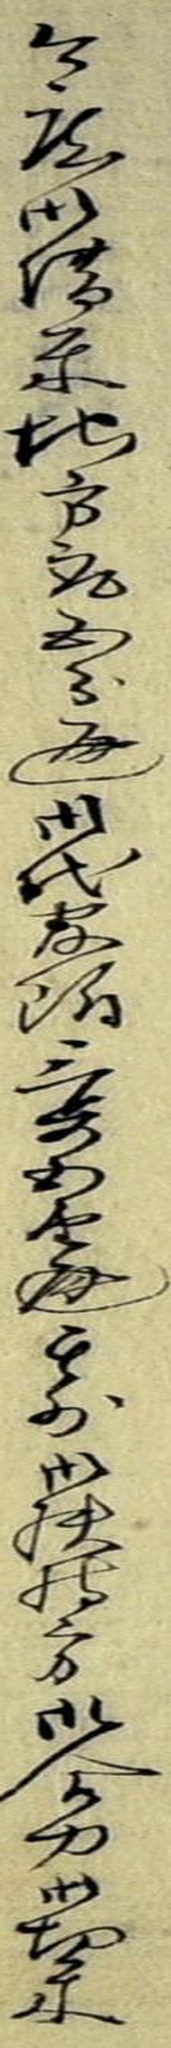今度御借米地方取五分通御代官附三歩五厘通其外御扶持方御合力御切米
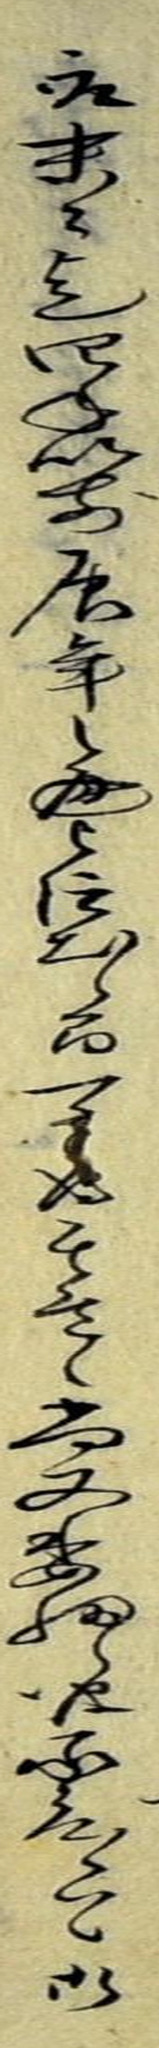取末々迄四年以前辰年之通被仰出候間可被得其意候尚又委細之儀承度候ハヽ御

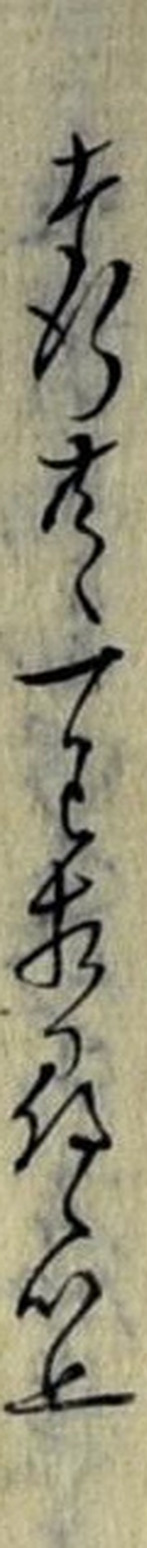奉行共へ可被相尋候以上
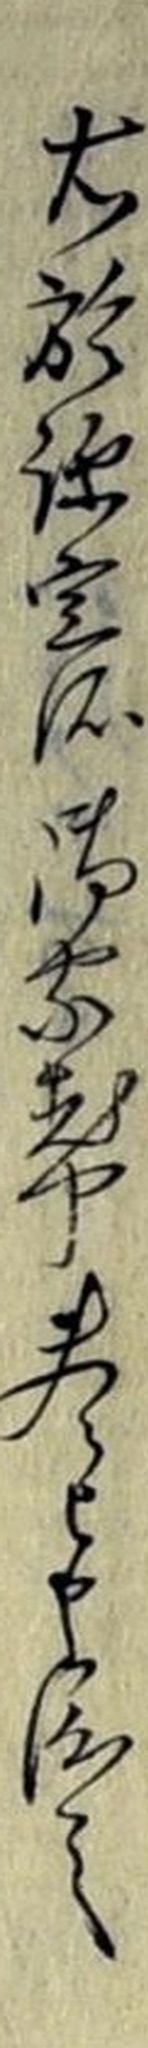右於評定所御家老中夫々被申渡之
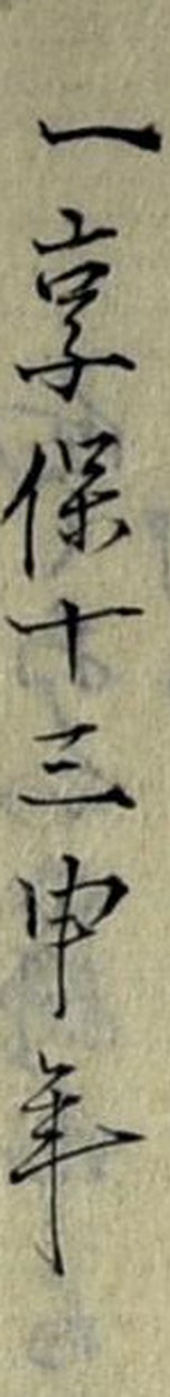一享保十三申年
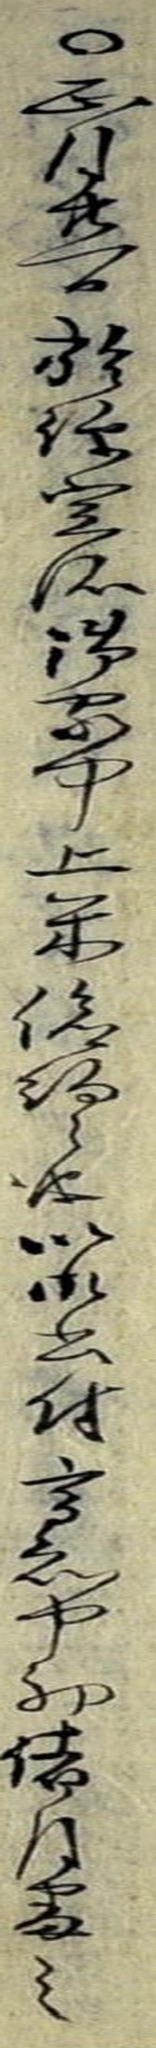〇正月廿一日於評定所御家中上米倹約之儀以御書付高知中初諸月番之
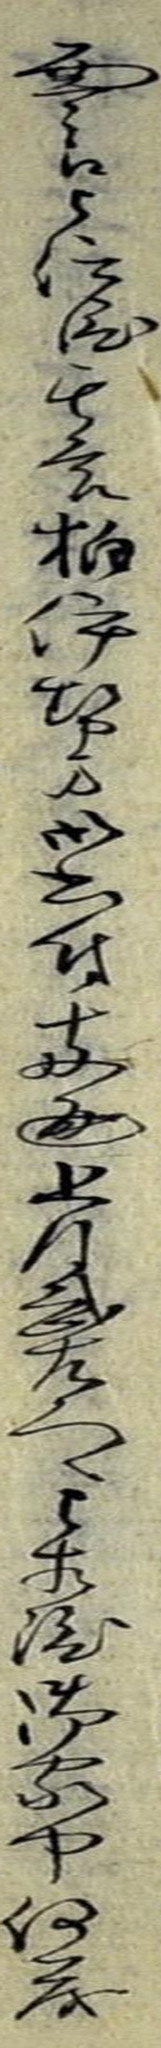面々江被仰渡其節狛伊勢方御書付両通上月武左衛門へ被相渡御家中何茂
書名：命令之部 一
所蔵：福井県文書館 Fukui Prefectural Archives
